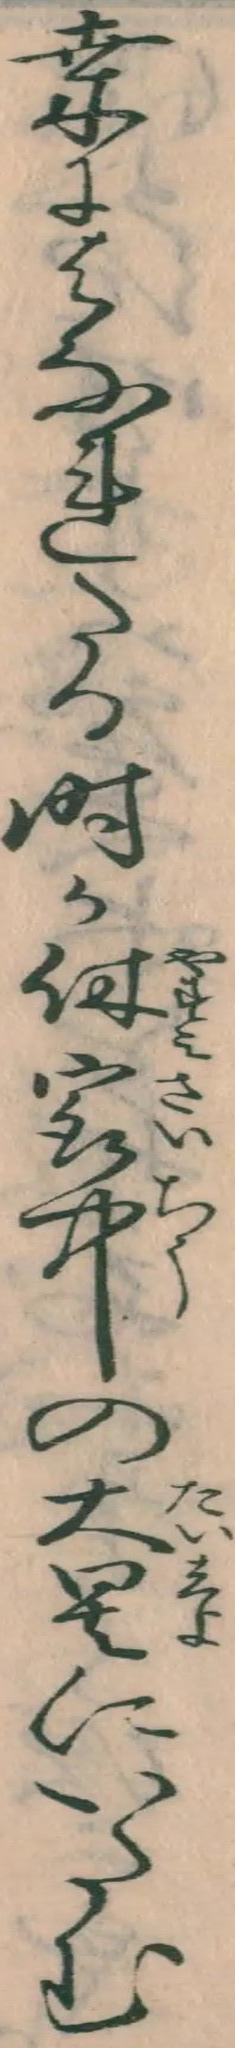桑にはなれたる時か休最中の大暑にいたむ
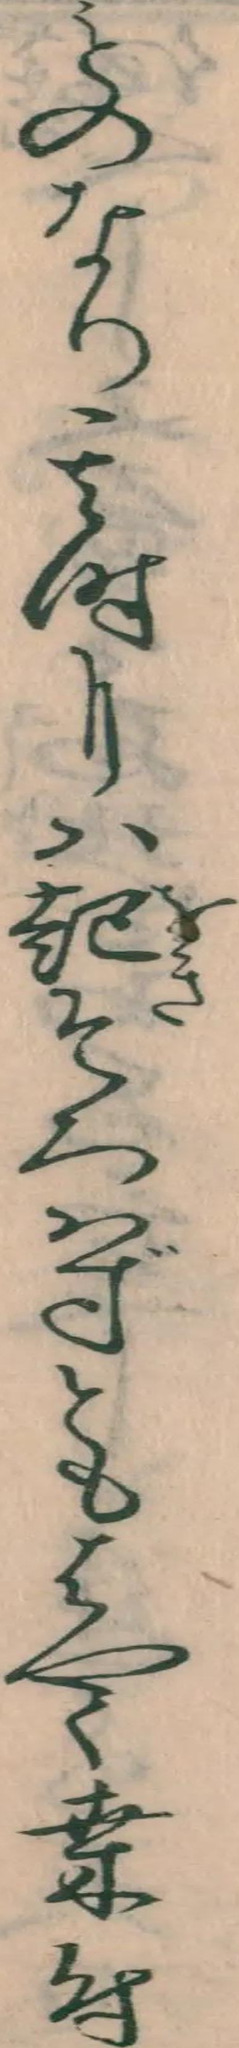ものなり其時には起そろはずともはやく桑付
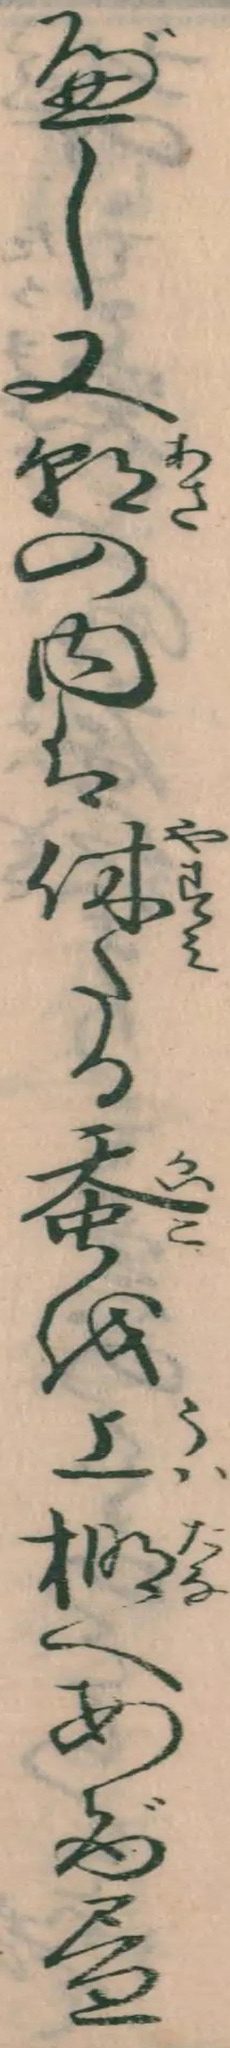べし又朝の内は休たる蚕を上棚へあげ昼
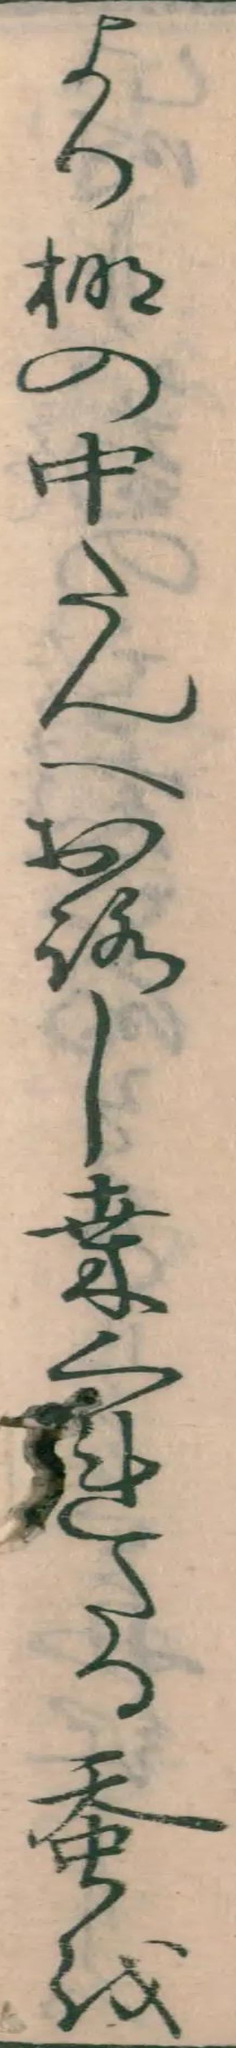より棚の中たんへおろし桑くれたる蚕を
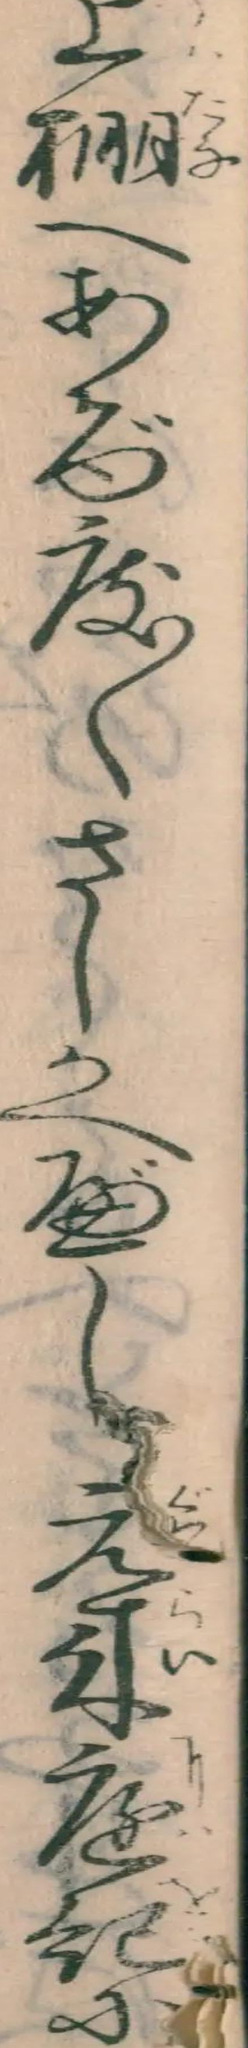上棚へあげ度〳〵さしかへべし元来庭起に
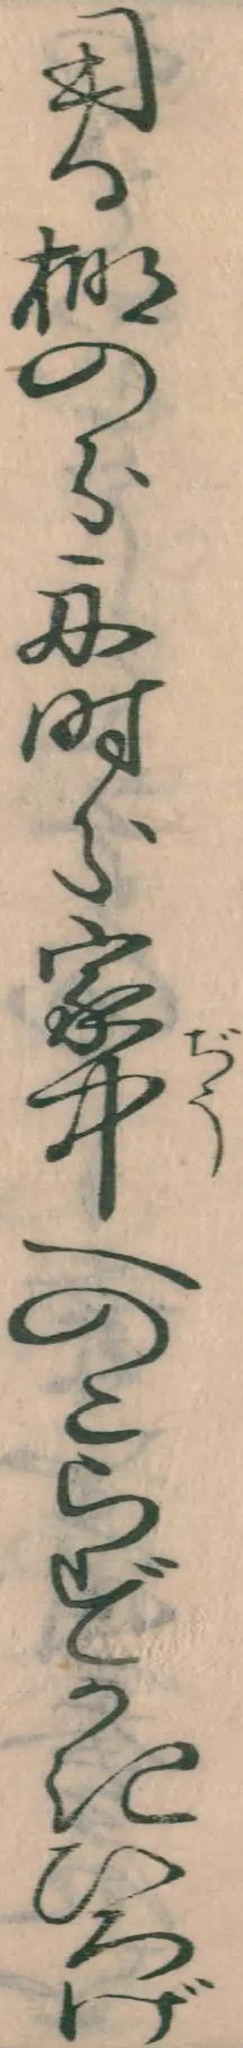用る棚の分舟時分家中へのこらずかきひろげ
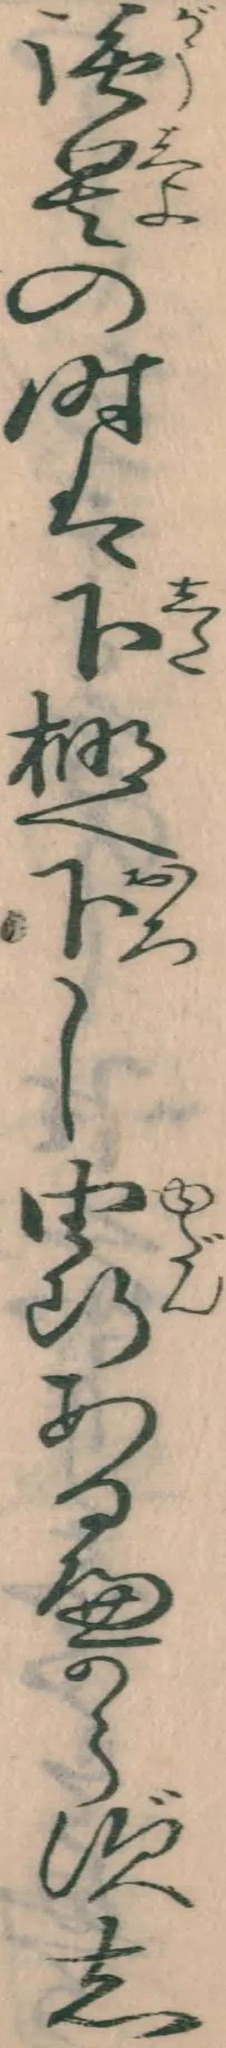強暑の時は下棚へ下し由断あるへからずし
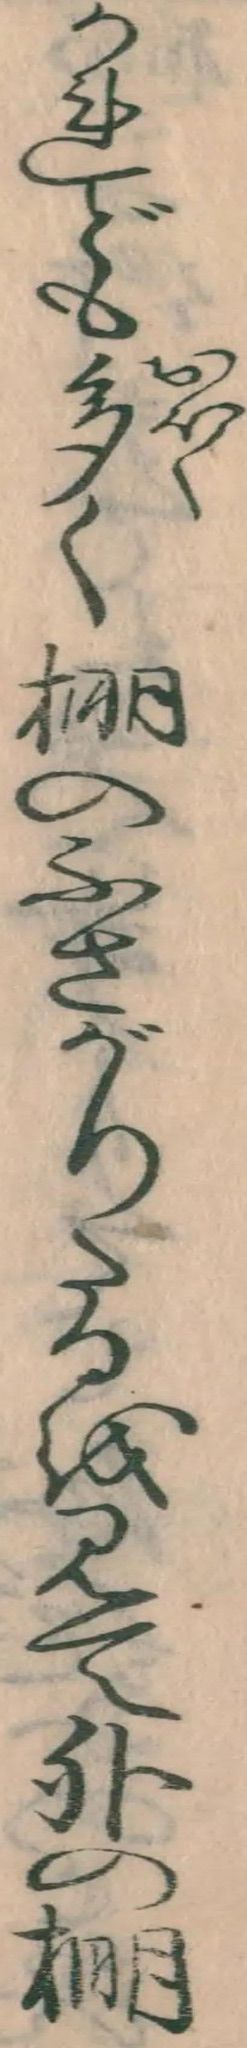かれども多く棚のふさがりたるを見て外の棚
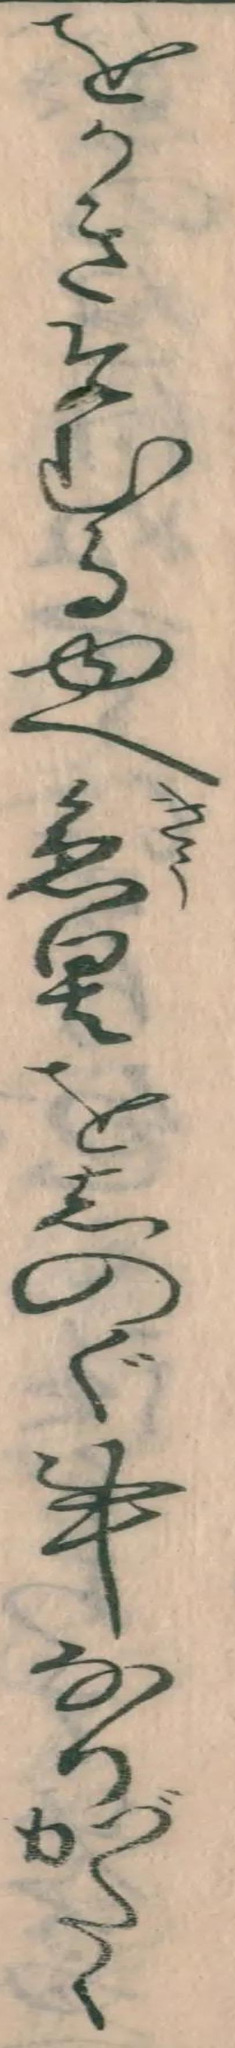をかきそむるゆへ急暑をしのぐ事なりがたく
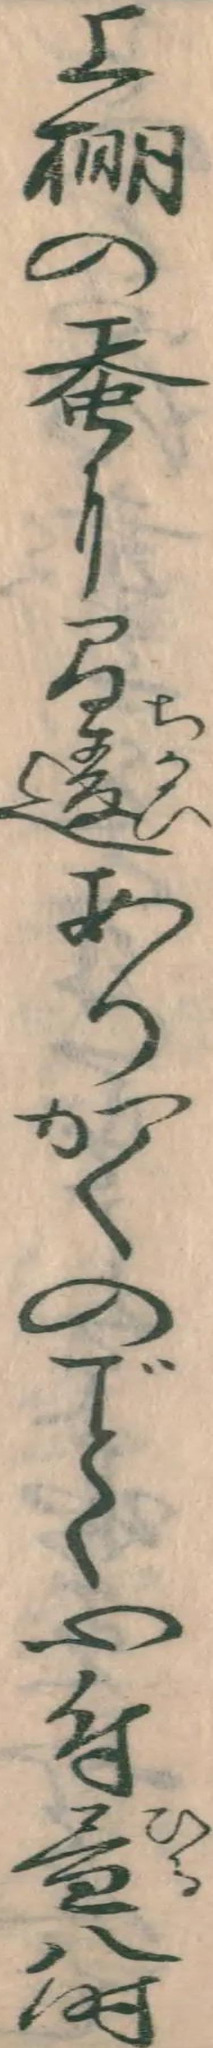上棚の蚕に間違ありかくのごとく心付昼八時
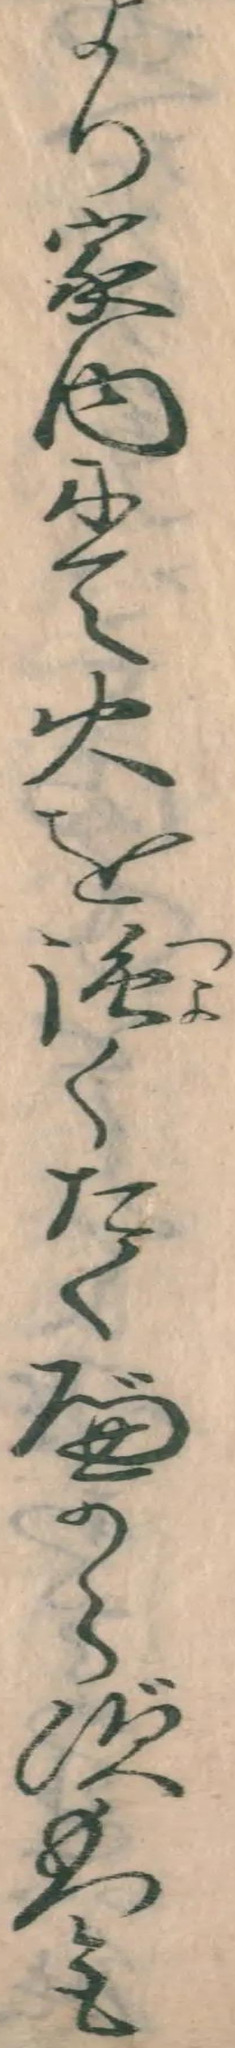より家内にて火を強くたくべからずもつとも
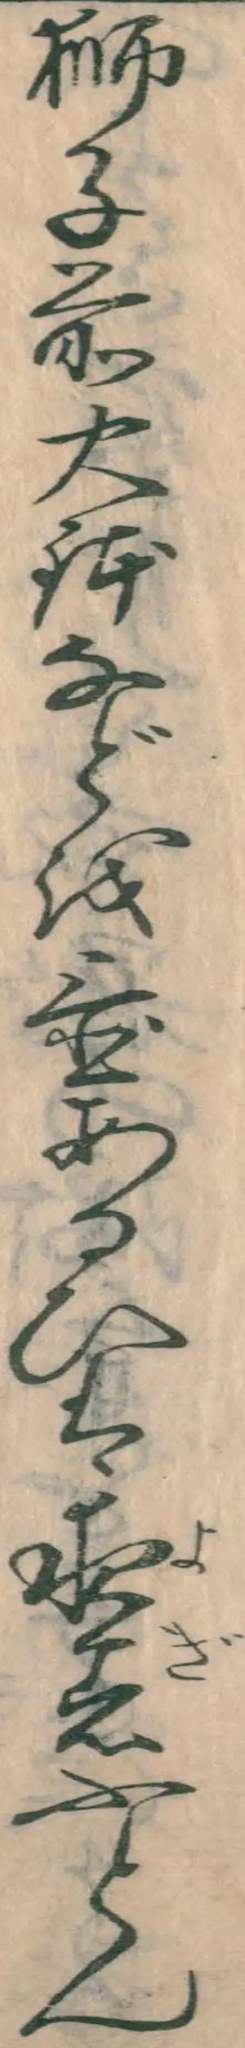獅子前火鉢などを置あるひは夜着ふとん
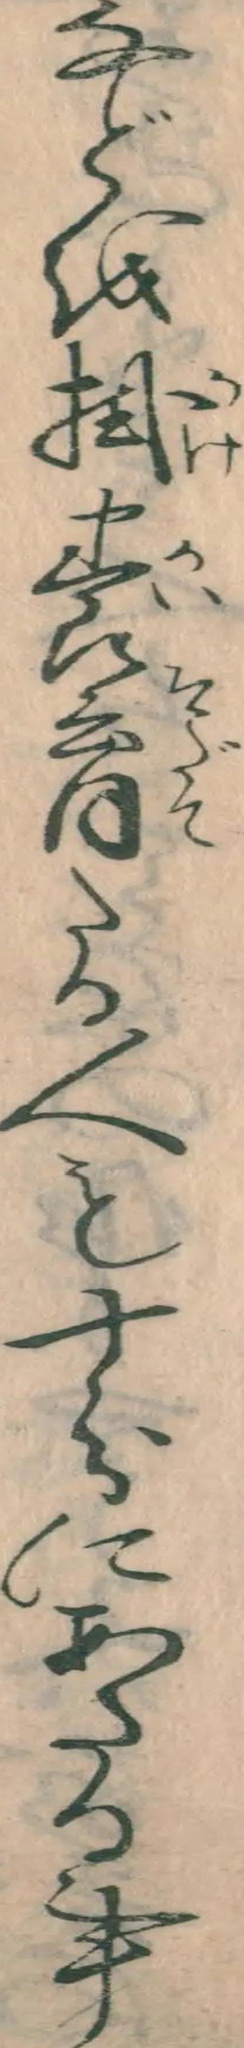などを掛養育たる人も十分にあたる事

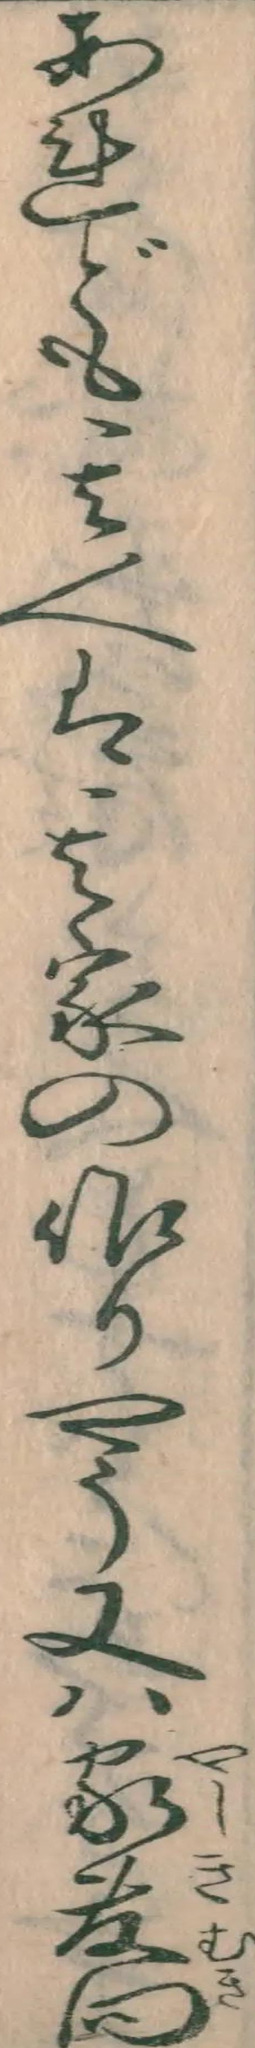あれども其人は其家の作りやう又は屋敷向
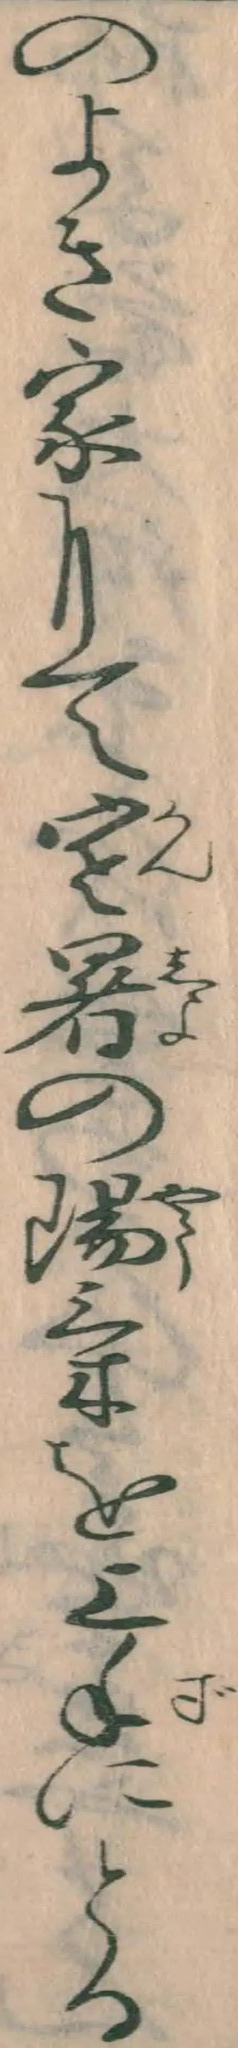のよき家にて寒暑の陽気を上手にとる
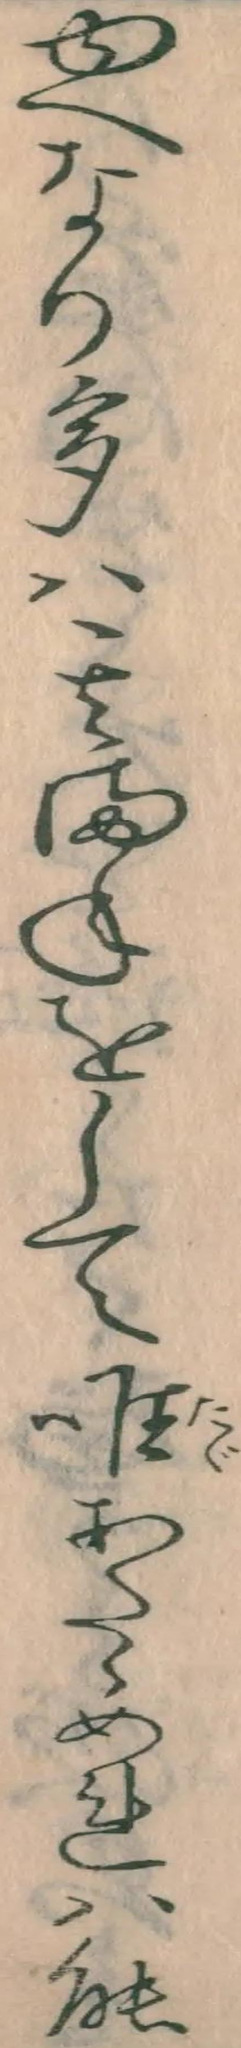ゆへなり多は其まねをして唯あたゝめれは能
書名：新撰養蚕秘書
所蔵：国立国会図書館 National Diet Library, JAPAN
